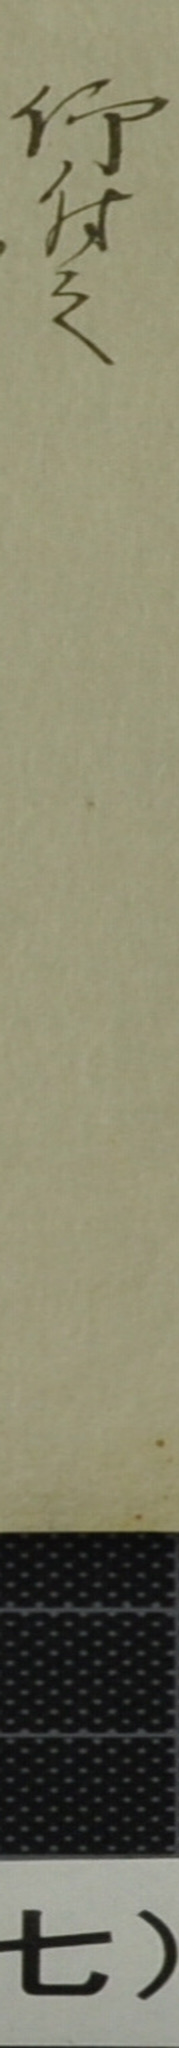仰付之
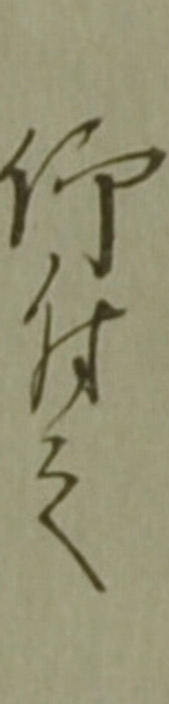仰付之
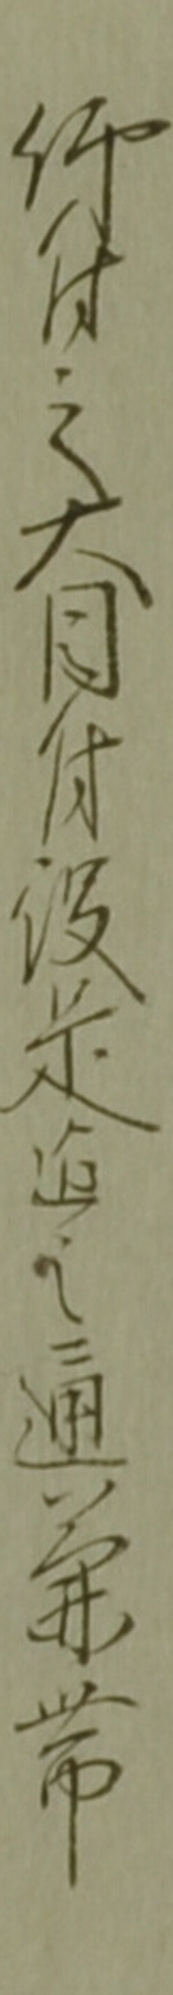仰付之大目付役是迄之通兼帯
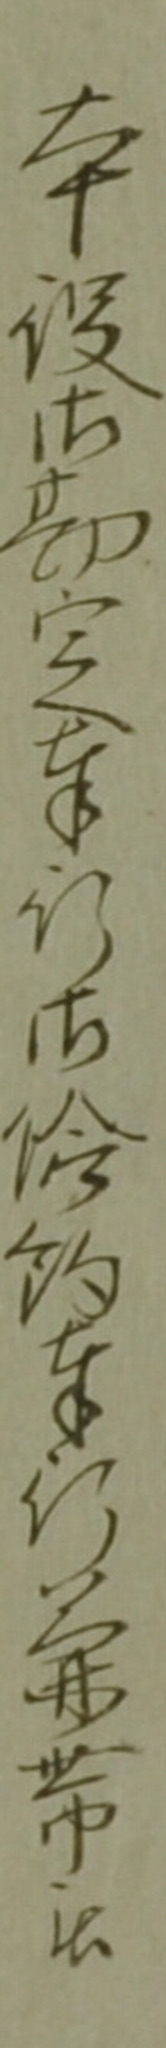本役御勘定奉行御倹約奉行兼帯被
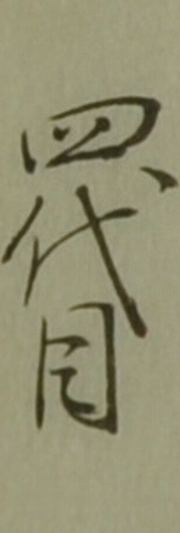四代目
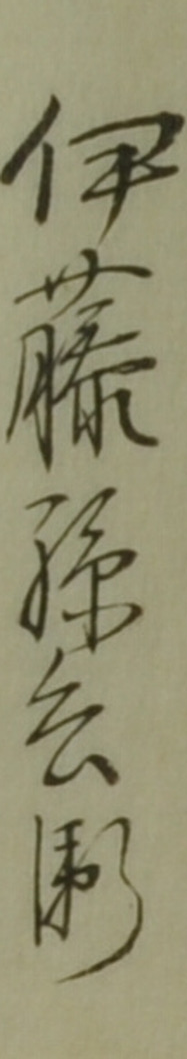伊藤孫兵衛
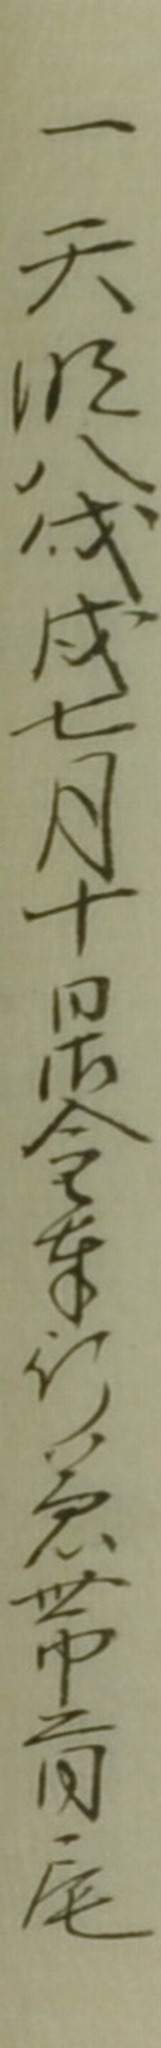一天明八戊戌七月十日御金奉行兼帯首尾
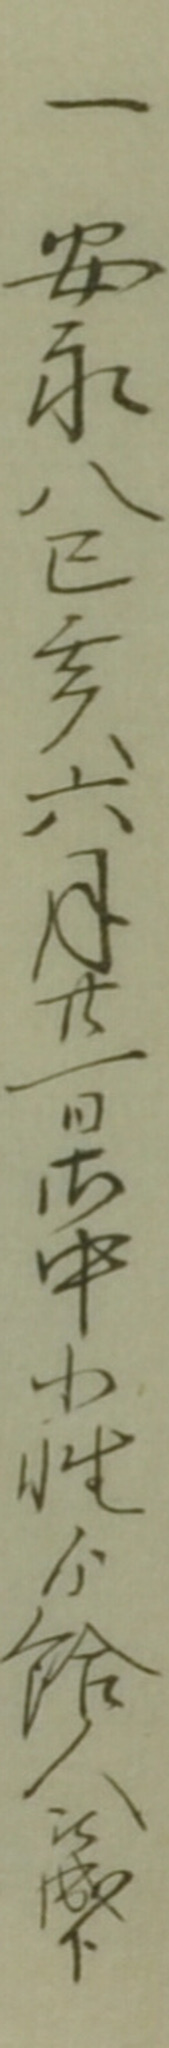一安永八己亥六月廿一日御中小性ゟ給人被成下
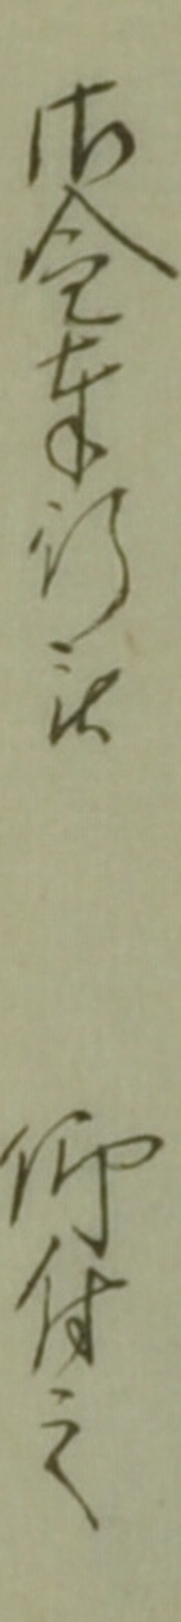御金奉行被仰付之
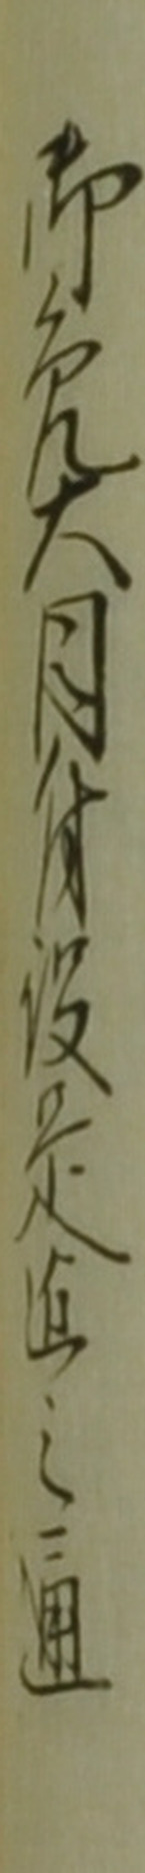能御免大目付役是迄之通
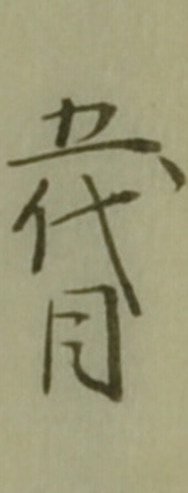五代目
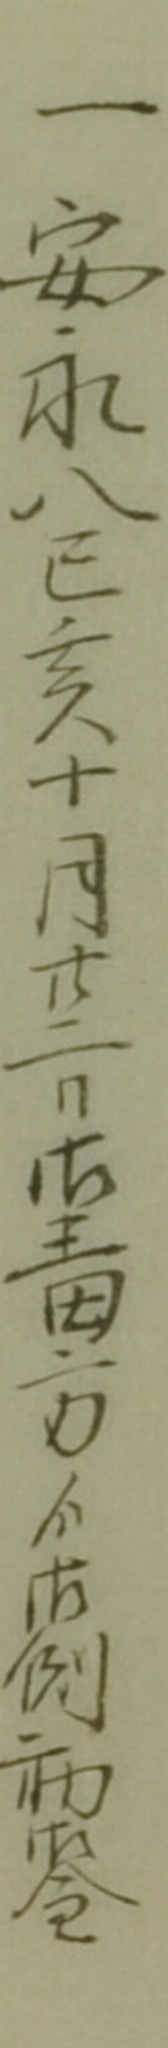一安永八己亥十月廿二日御番方ゟ御側勤御金
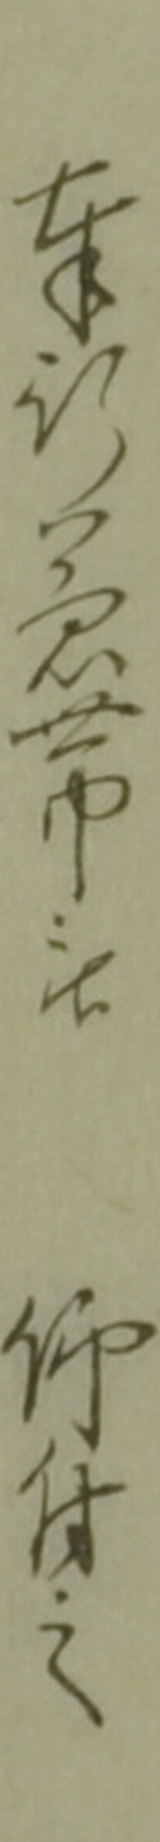奉行兼帯被仰付之
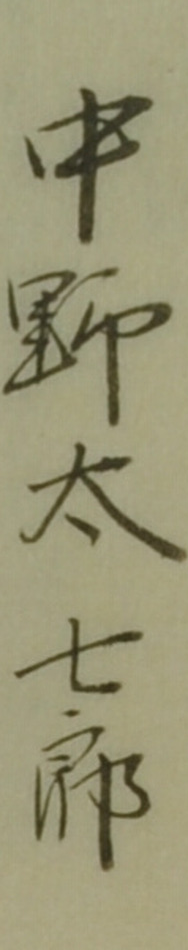中野太七郎
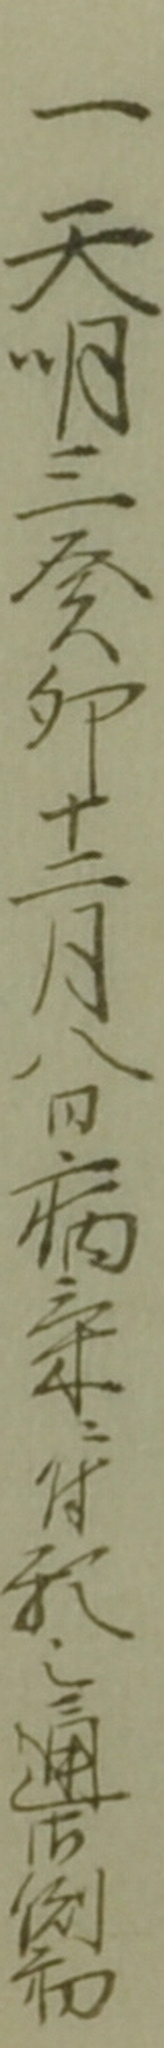一天明三癸卯十二月八日病気ニ付願之通御側勤
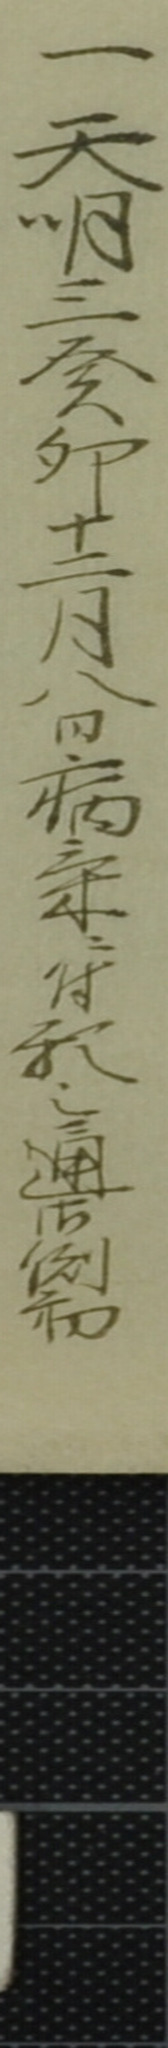一天明三癸卯十二月八日病気ニ付願之通御側勤
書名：諸御役代々録（七）
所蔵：伊那市立高遠町図書館・合同会社AMANE
